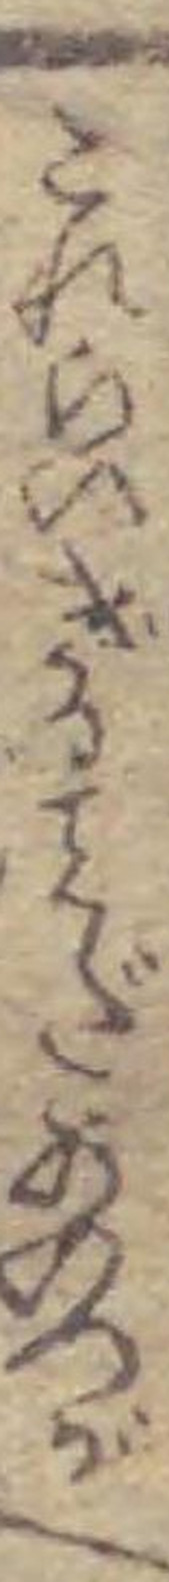これらいぎかことだあいつが
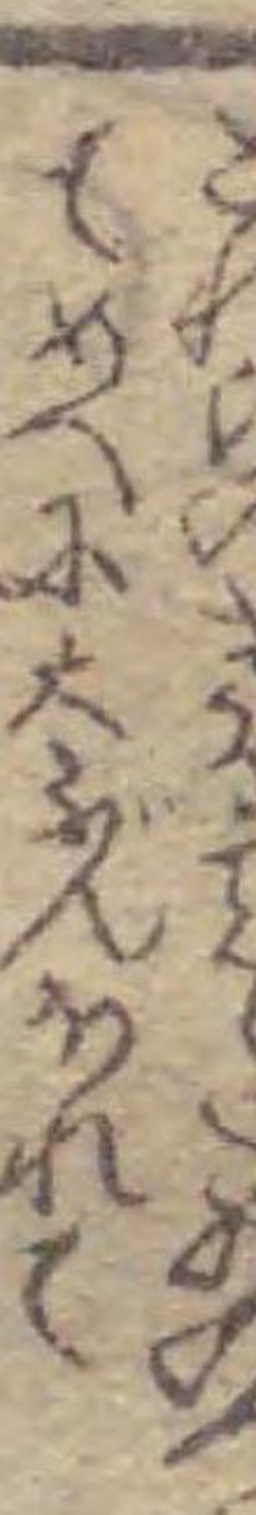てめへに大ぶんほれて
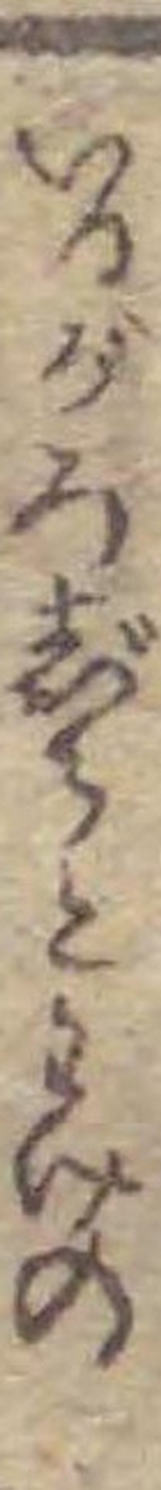いるがろじうとわけの
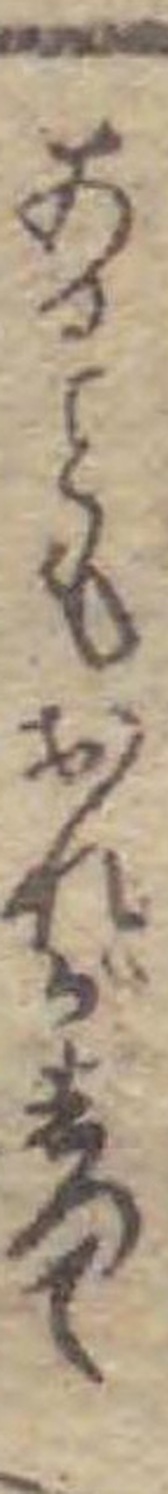あることもおれがしつて
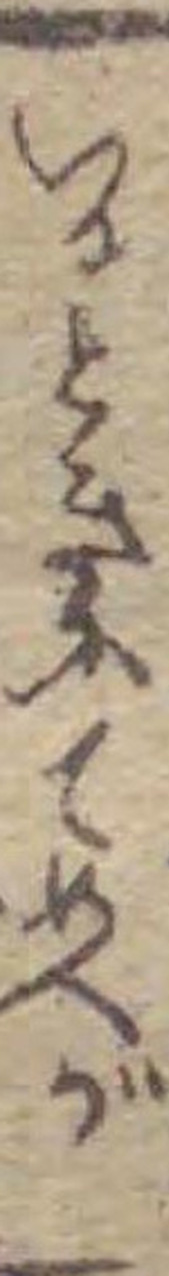いるときにてめへが
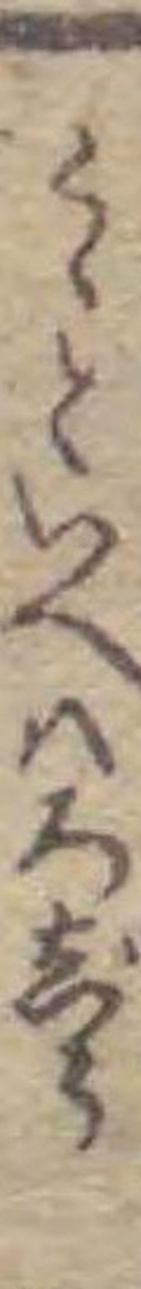こゝといへはろじう
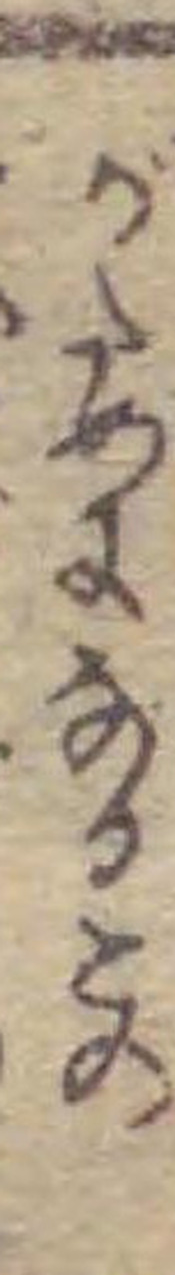がためになるこの
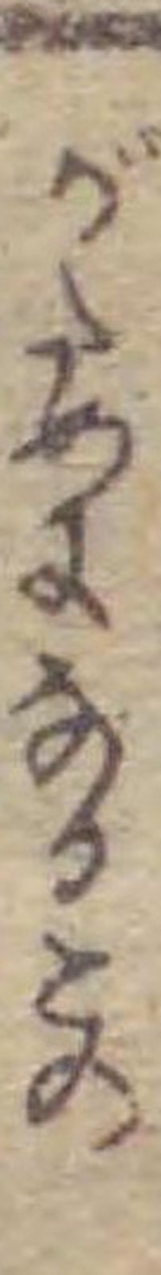がためになるこの
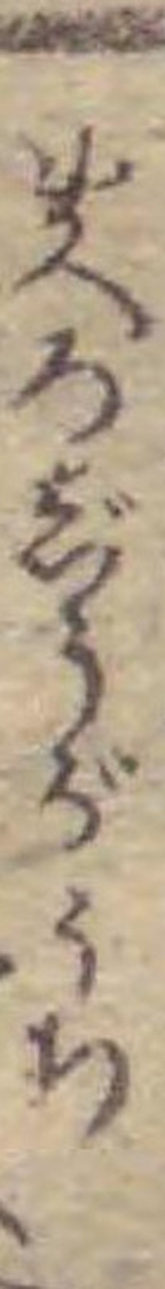まへろじうがうち
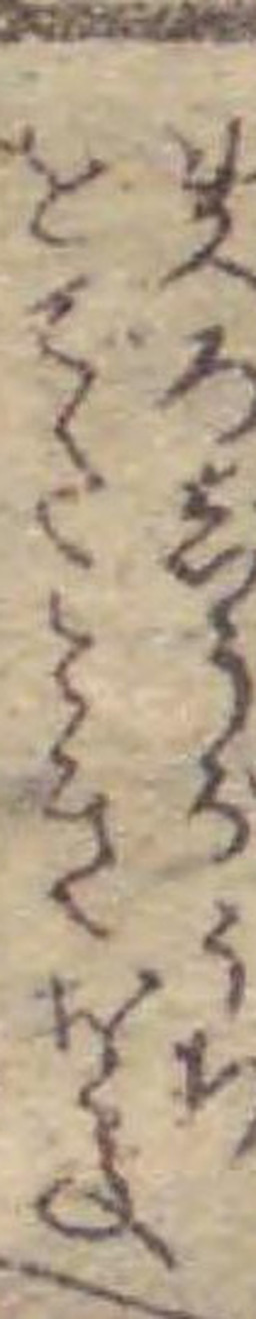をでたときおとよ
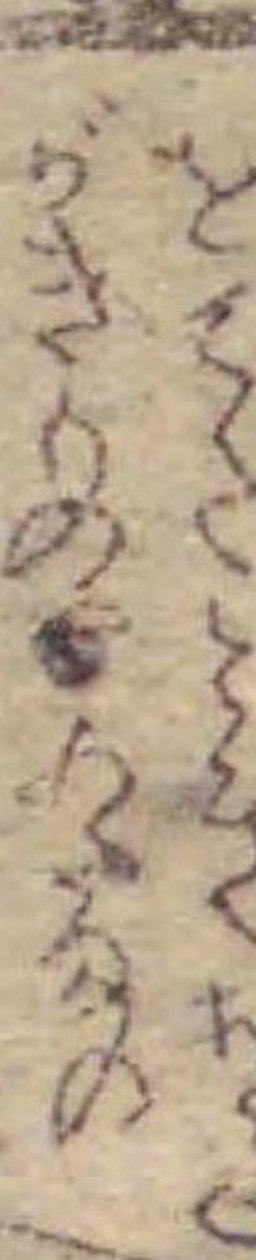がきものやあたまの
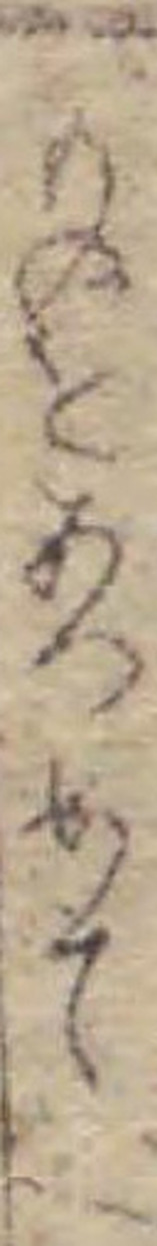ものをあつめて
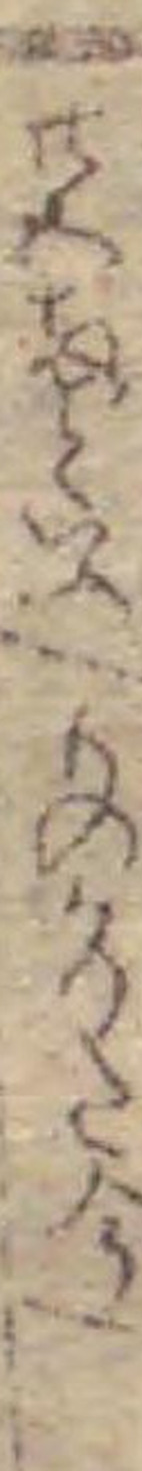廿五両といふものかりた今
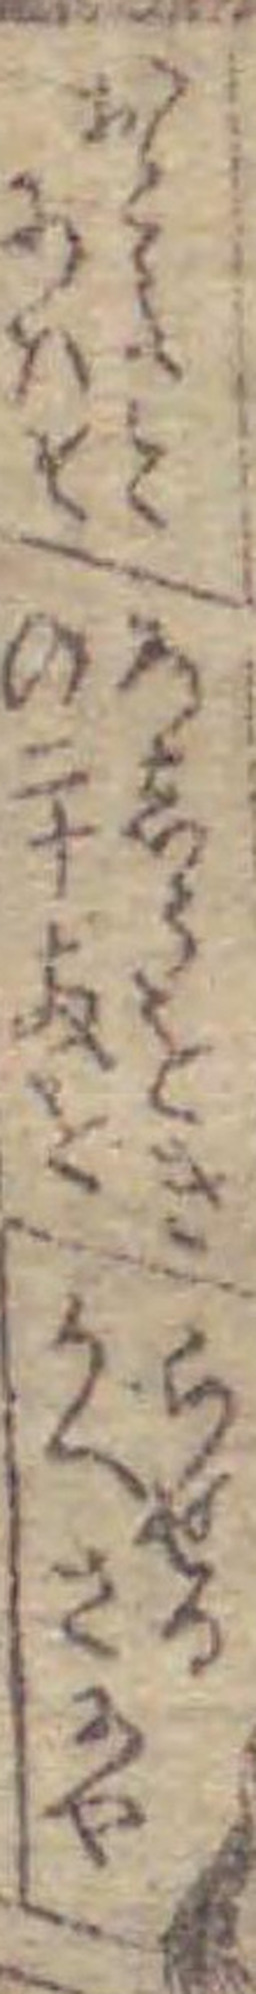にはその二十両をかへさにや
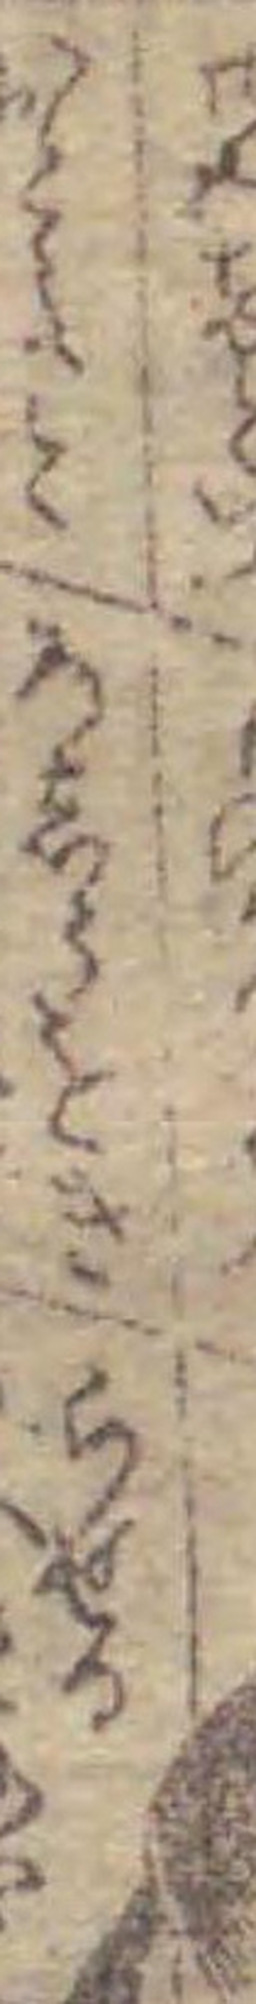おとよとろしうをきらせる
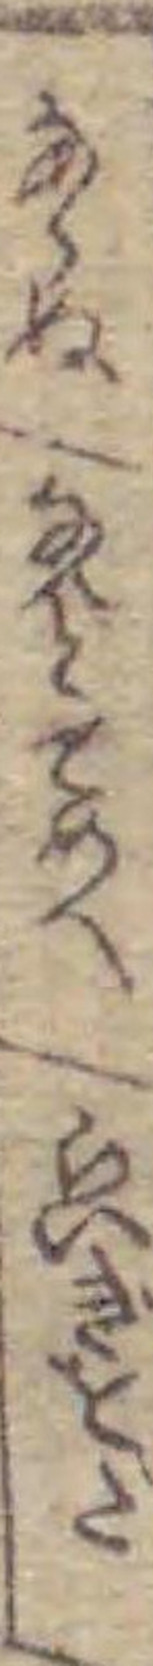ならぬなんどてめへらいぎをだ
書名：芸者呼子鳥 : 2巻（松泉堂）
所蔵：国立国会図書館 National Diet Library, JAPAN
